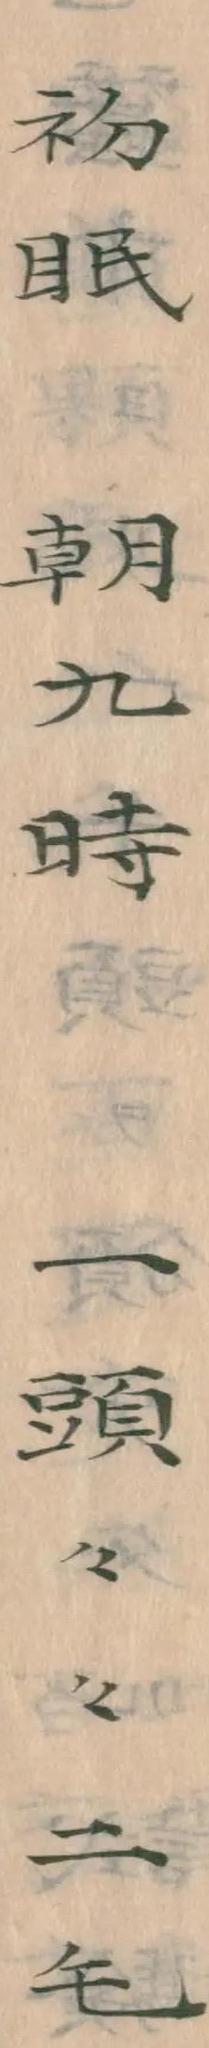初眠朝九時一頭々々二毛
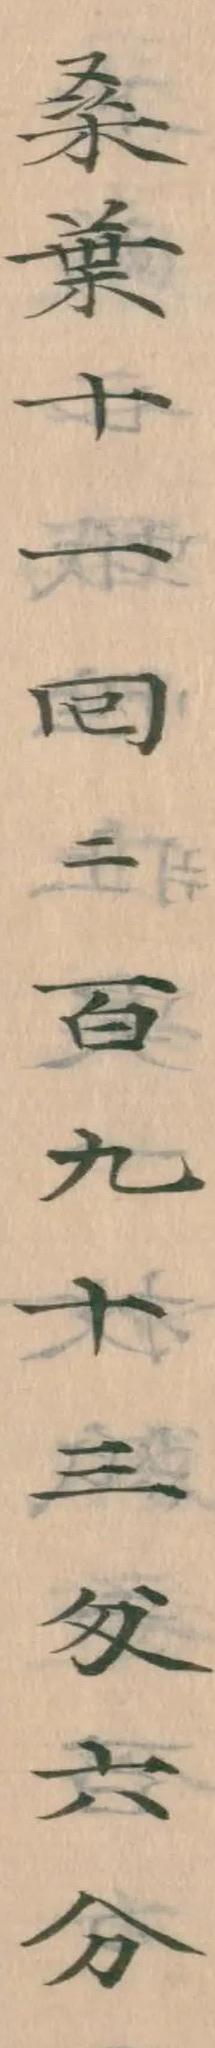桑葉十一回ニ百九十三匁六分
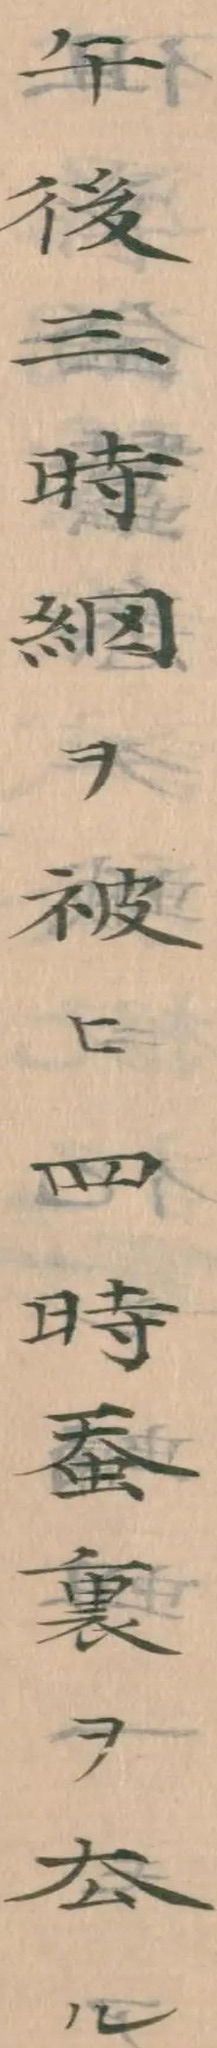午後三時網ヲ被ヒ四時蚕裏ヲ去ル
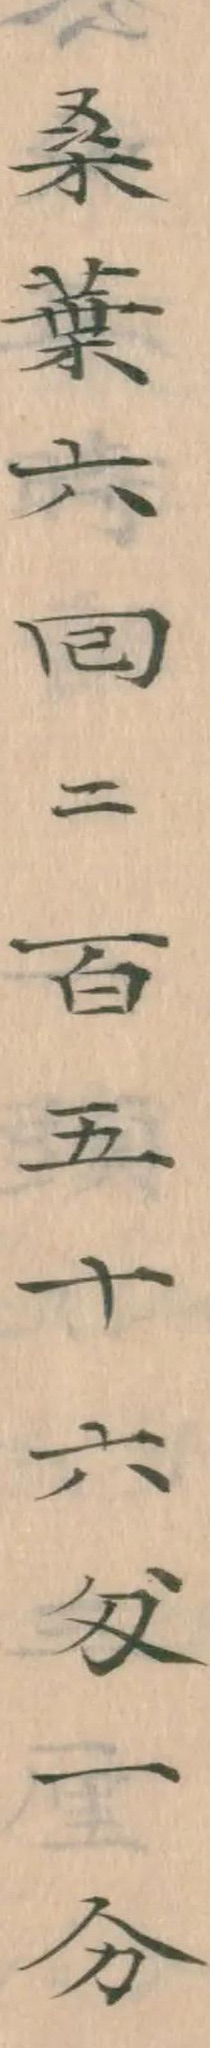桑葉六回ニ百五十六匁一分
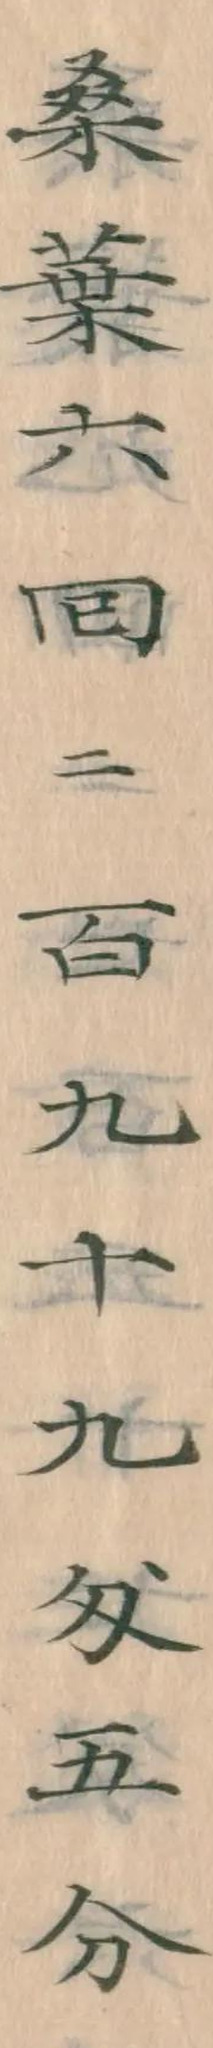桑葉六回ニ百九十九匁五分
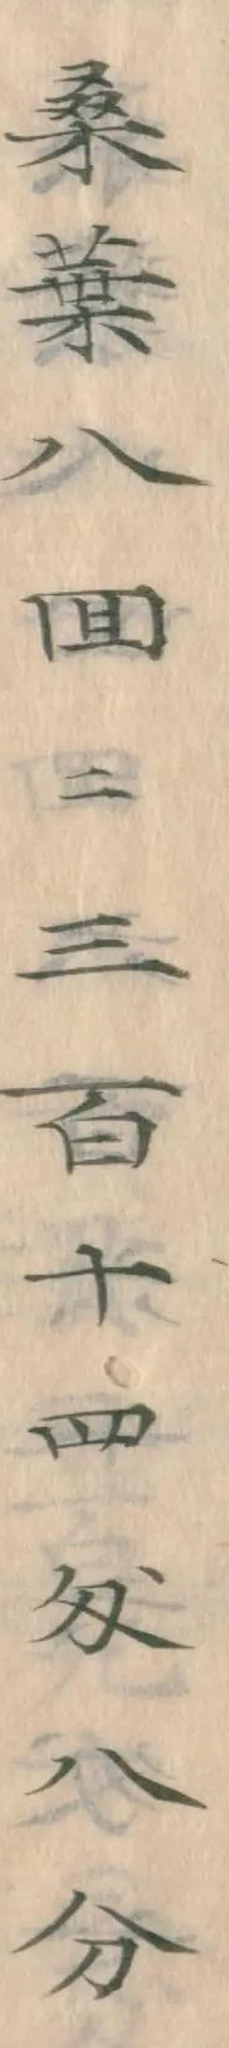桑葉八回ニ三百十四匁八分
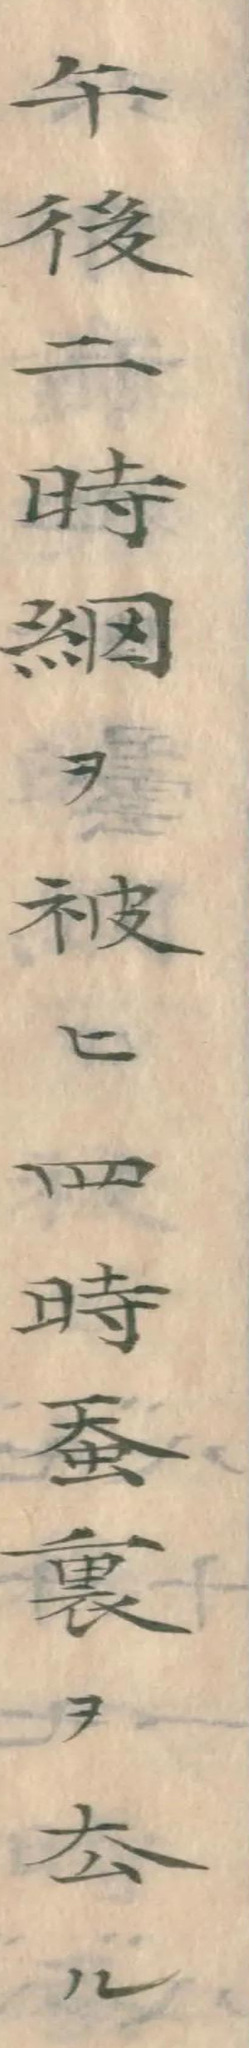午後二時網ヲ被ヒ四時蚕裏ヲ去ル
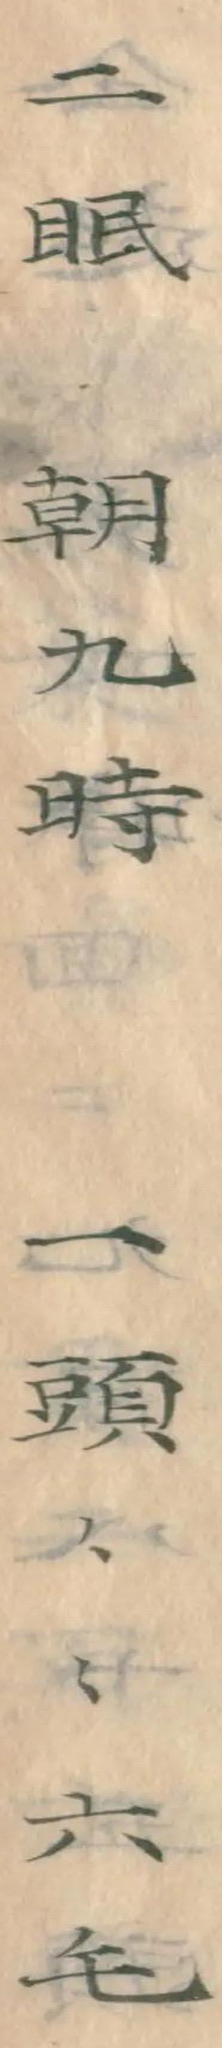二眠朝九時一頭々々六毛

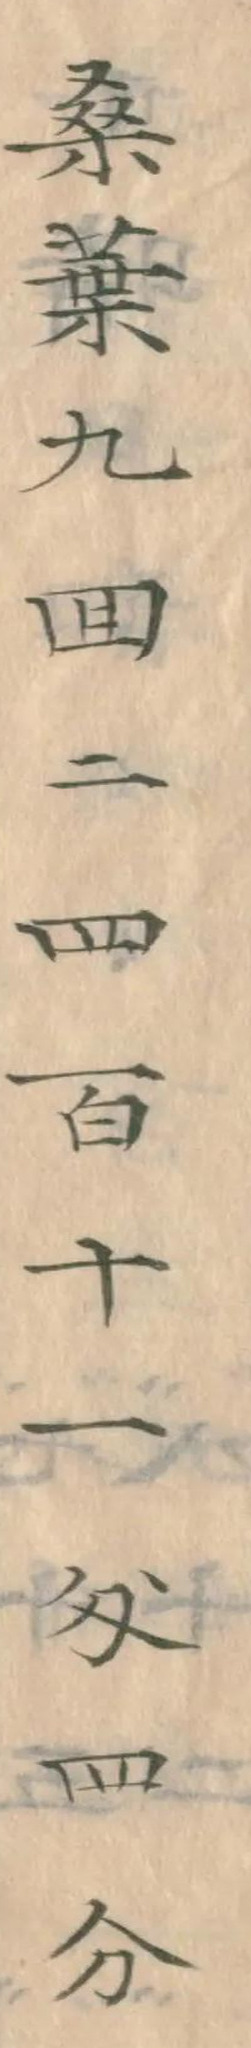桑葉九回ニ四百十一匁四分
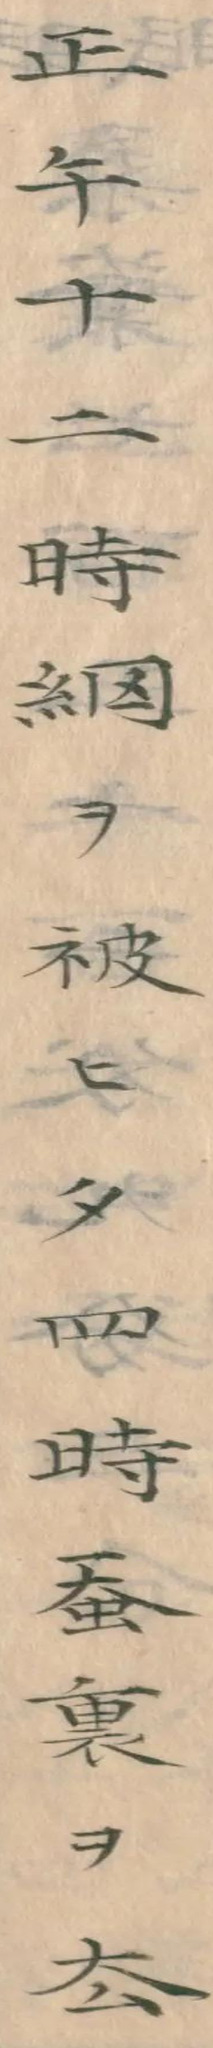正午十二時網ヲ被ヒ夕四時蚕裏ヲ去
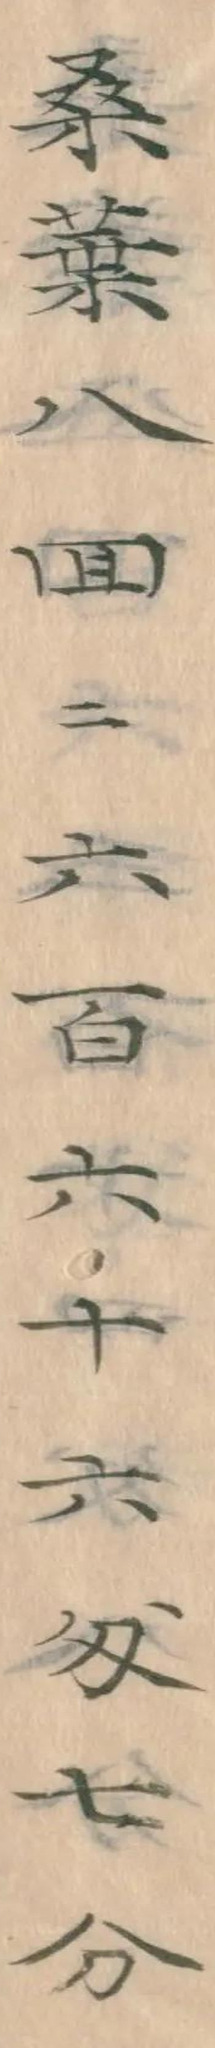桑葉八回ニ六百六十六匁七分
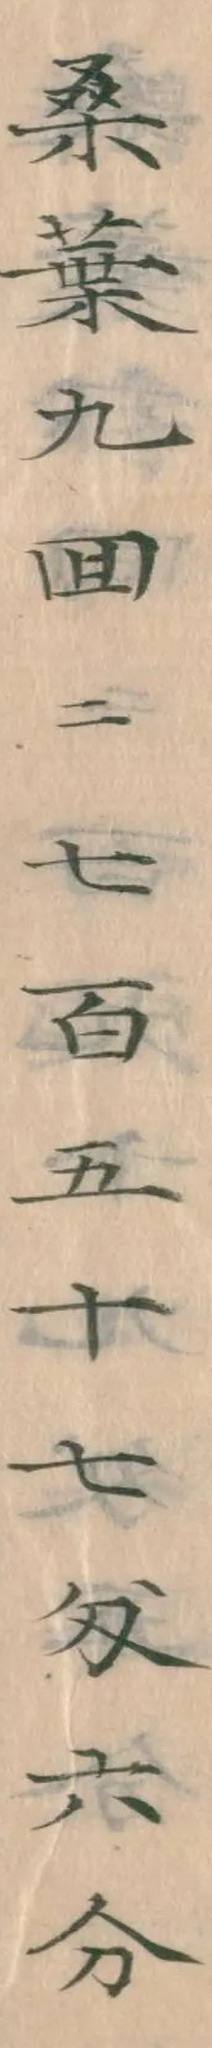桑葉九回ニ七百五十七匁六分
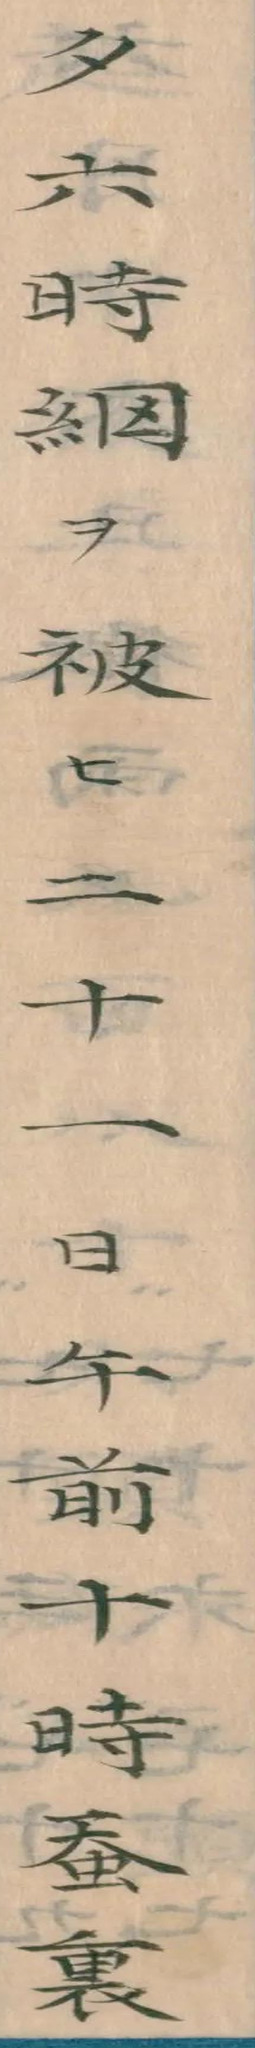夕六時網ヲ被ヒ二十一日午前十時蚕裏
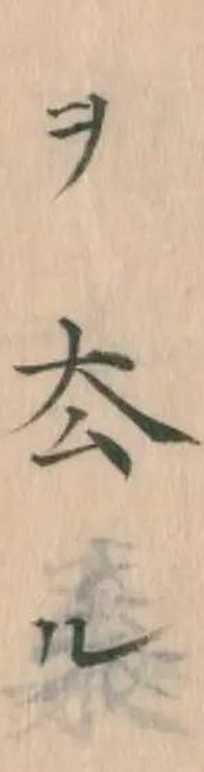ヲ去ル
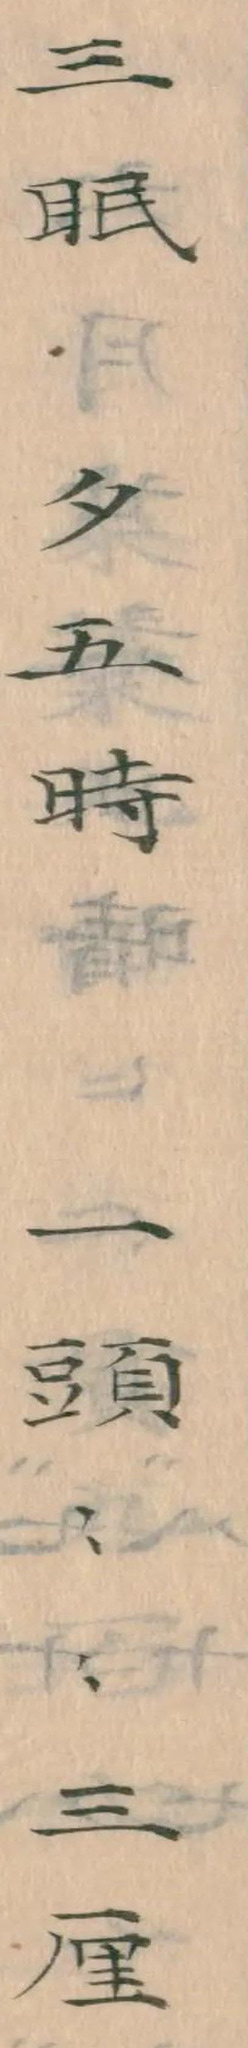三眠夕五時一頭々々三厘
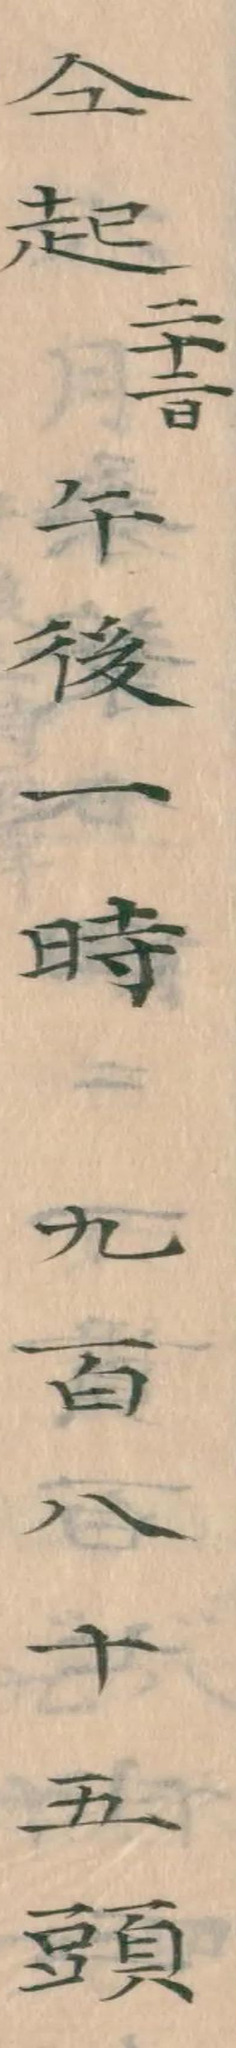仝起二十二日午後一時九百八十五頭
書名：蚕桑集成
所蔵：国立国会図書館 National Diet Library, JAPAN
